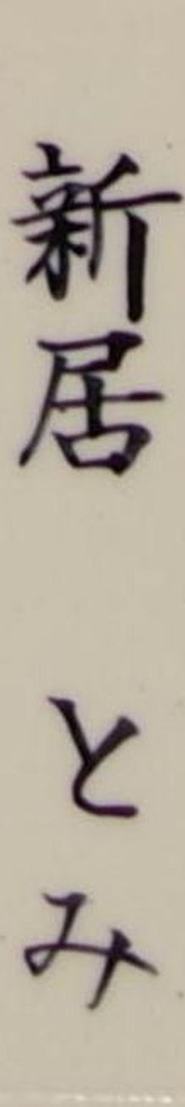新居とみ
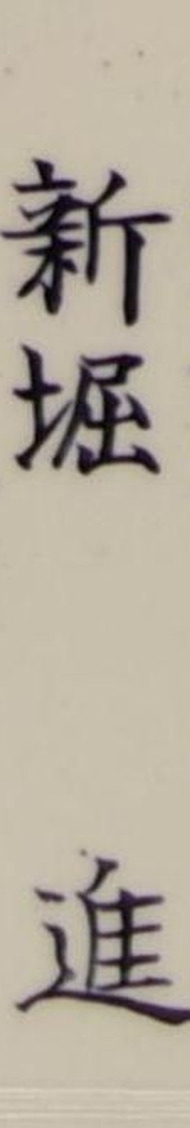新堀進
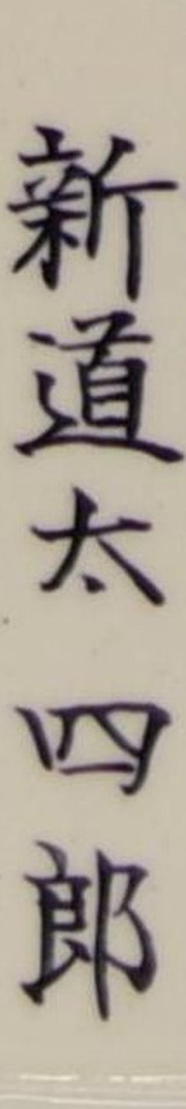新道太四郎
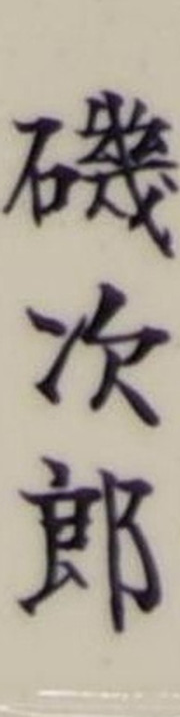磯次郎
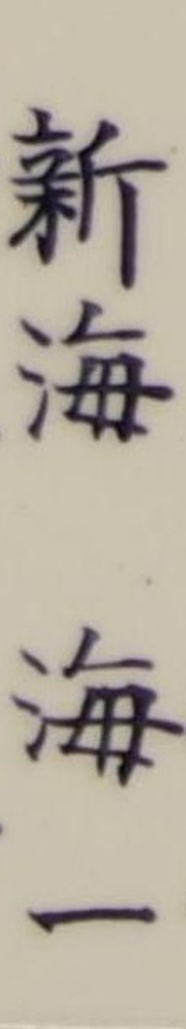新海海一
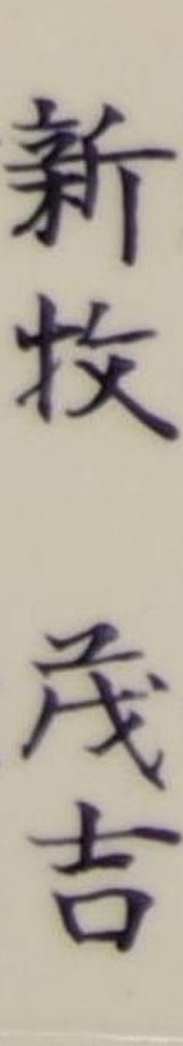新牧茂吉

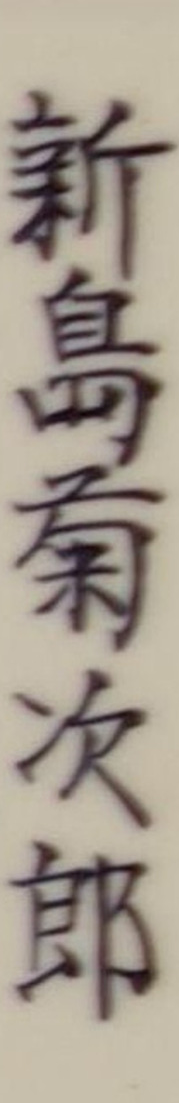新島菊次郎
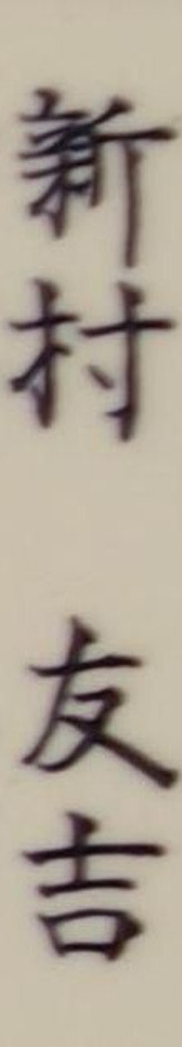新村友吉
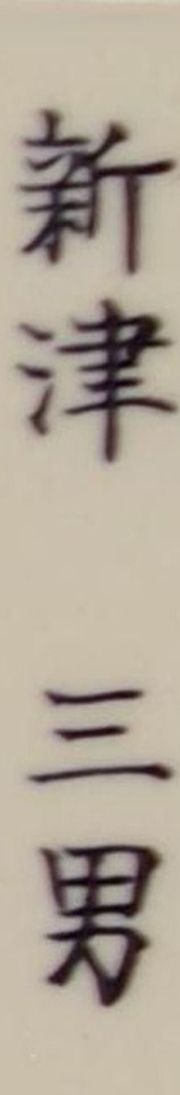新津三男
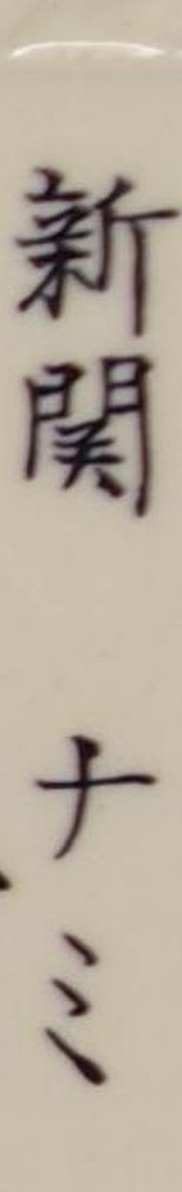新関ナミ
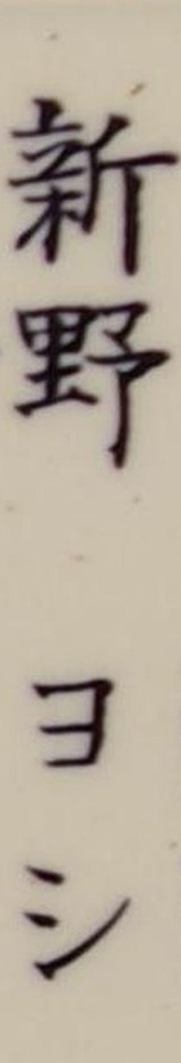新野ヨシ
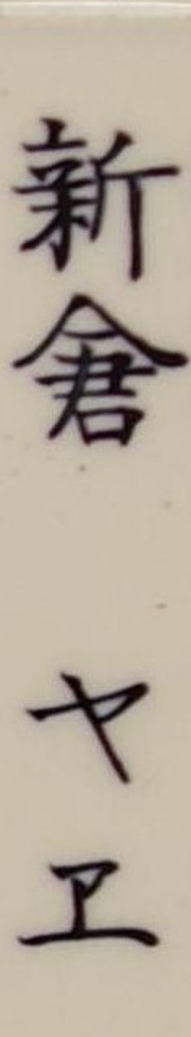新倉ヤエ
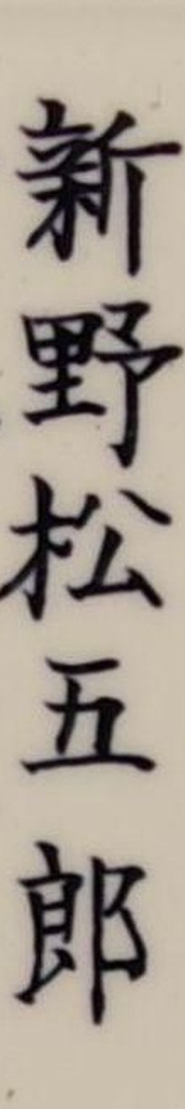新野松五郎
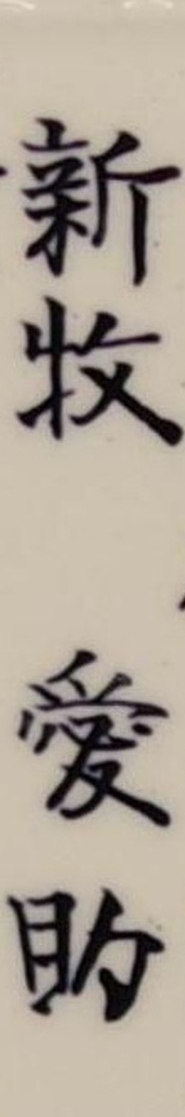新牧愛助
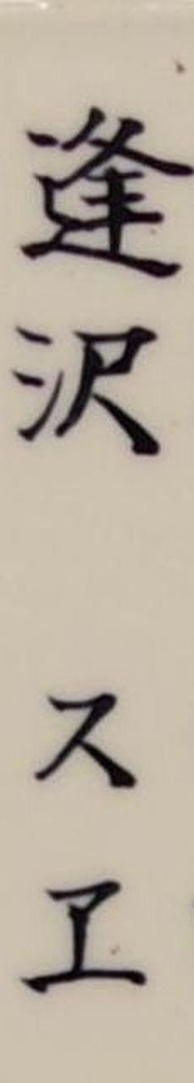逢沢スエ
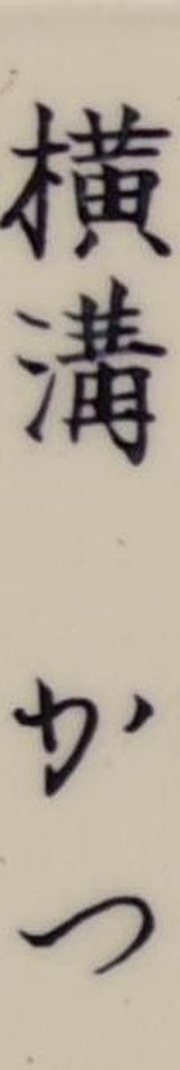横満かつ
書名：E~L
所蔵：高野山金剛峯寺
